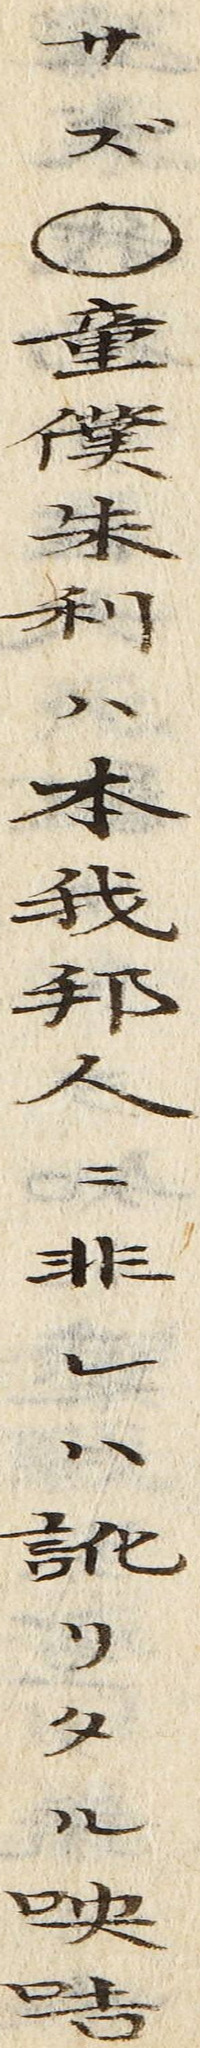サズ○童僕朱利ハ本我邦人ニ非レハ訛リタル咉咭
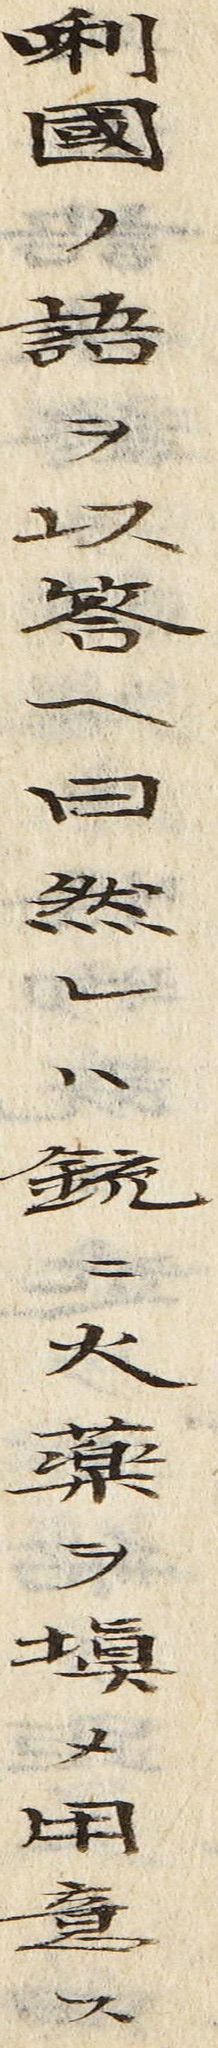唎国ノ語ヲ以答へ曰然レハ銃ニ火薬ヲ填メ用意ス
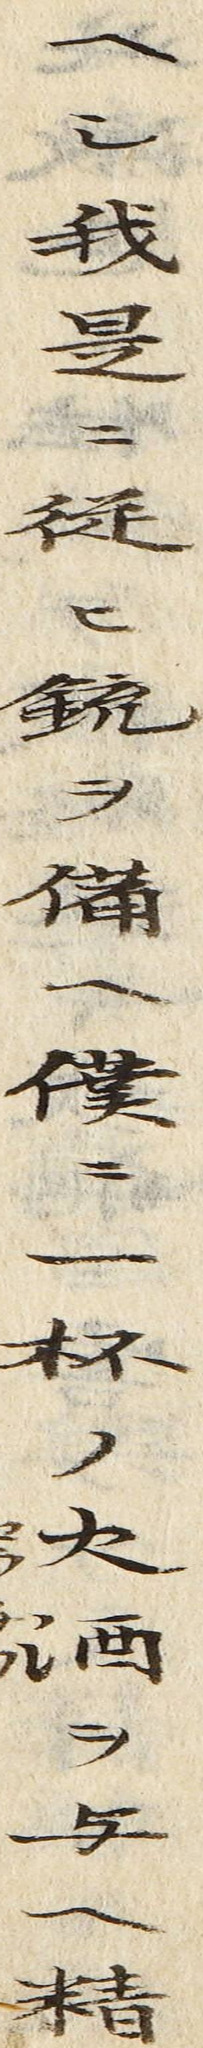ヘシ我是ニ従ヒ銃ヲ備ヘ僕ニ一杯ノ火酒ヲ与ヘ精
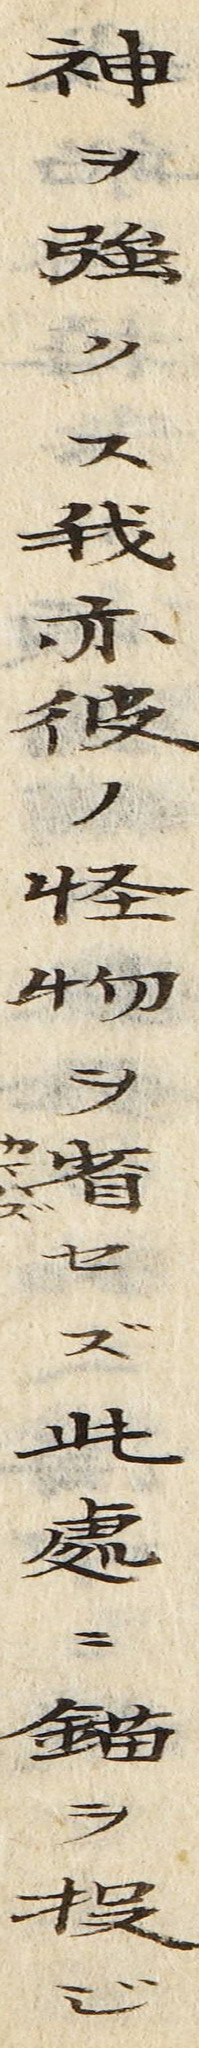神ヲ強クス我亦彼ノ怪物ヲ省セズ此処ニ錨ヲ投ジ
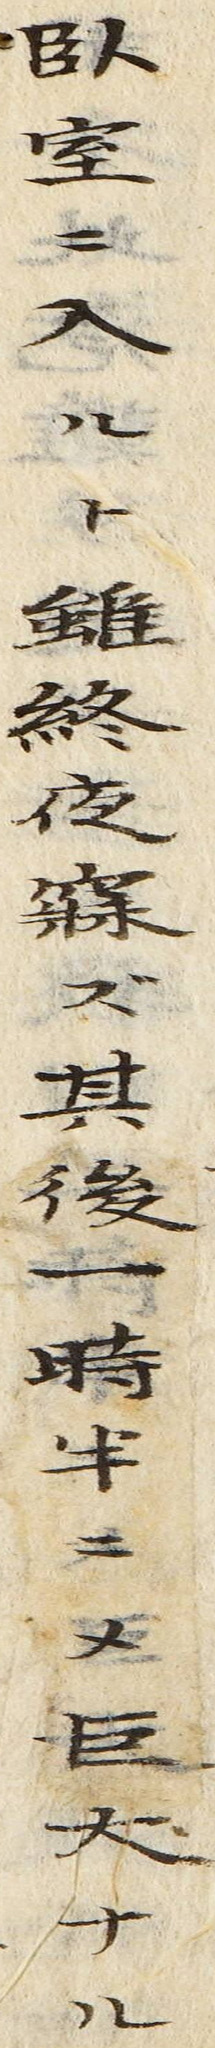臥室ニ入ルト雖終夜寐ズ其後一時半ニシテ巨大ナル
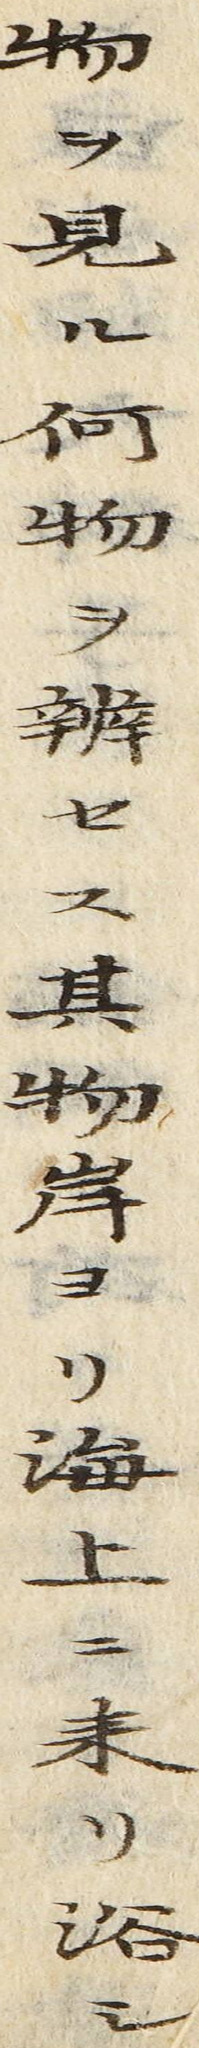物ヲ見ル何物ヲ弁セス其物岸ヨリ海上ニ来リ浴シ
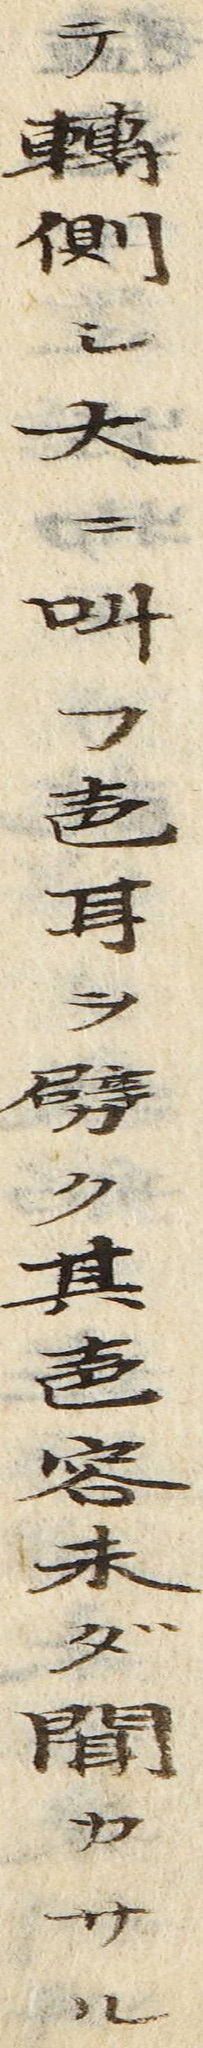テ転側シ大ニ叫フ声耳ヲ劈ク其声容未ダ聞カサル
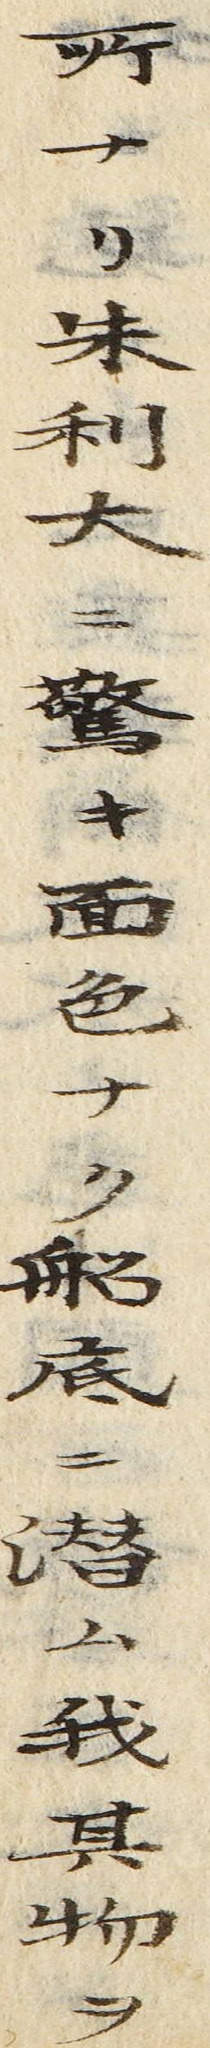所ナリ朱利大ニ驚キ面色ナク船底ニ潜ム我其物ヲ

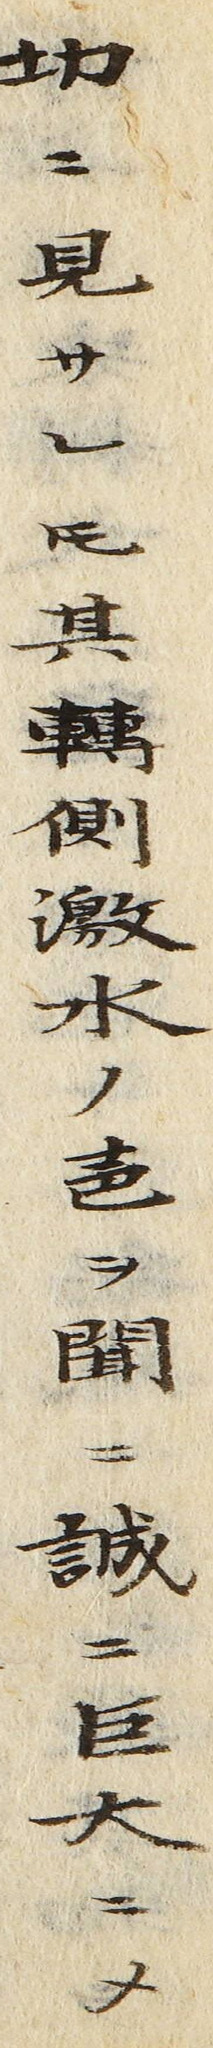切ニ見サレトモ其転側激水ノ声ヲ聞ニ誠ニ巨大ニシテ
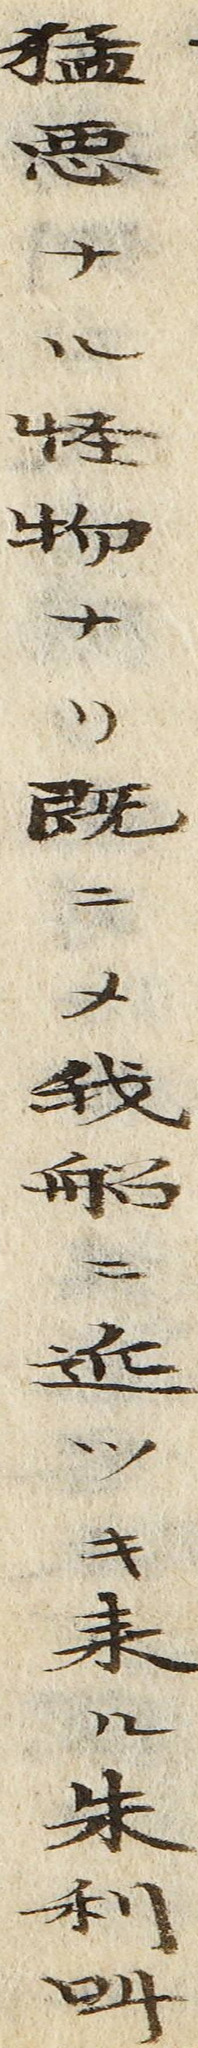猛悪ナル怪物ナリ既ニシテ我船ニ近ツキ来ル朱利叫
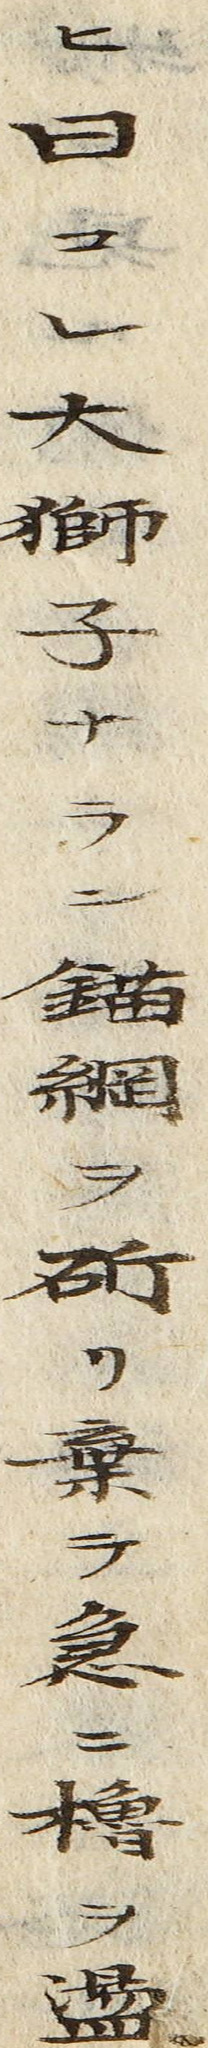ヒ曰コレ大獅子ナラン錨綱ヲ斫リ棄テ急ニ櫓ヲ盪
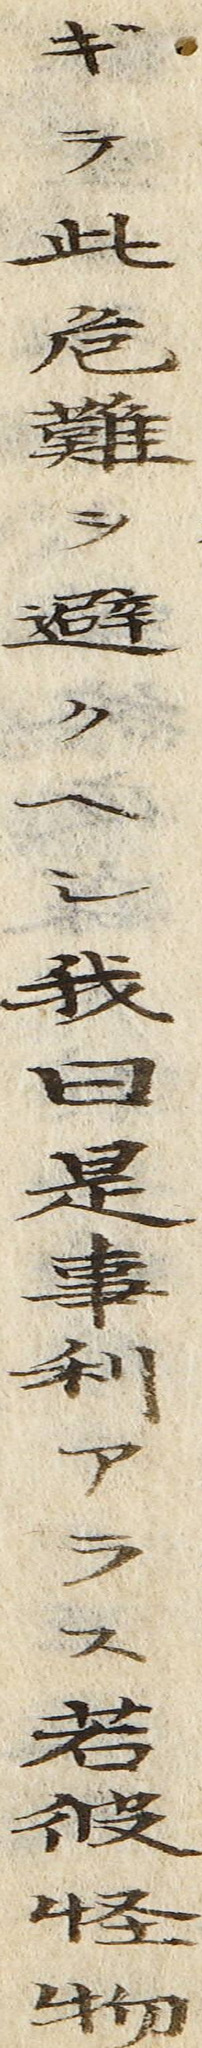ギテ此危難ヲ避クヘシ我曰是事利アラス若彼怪物
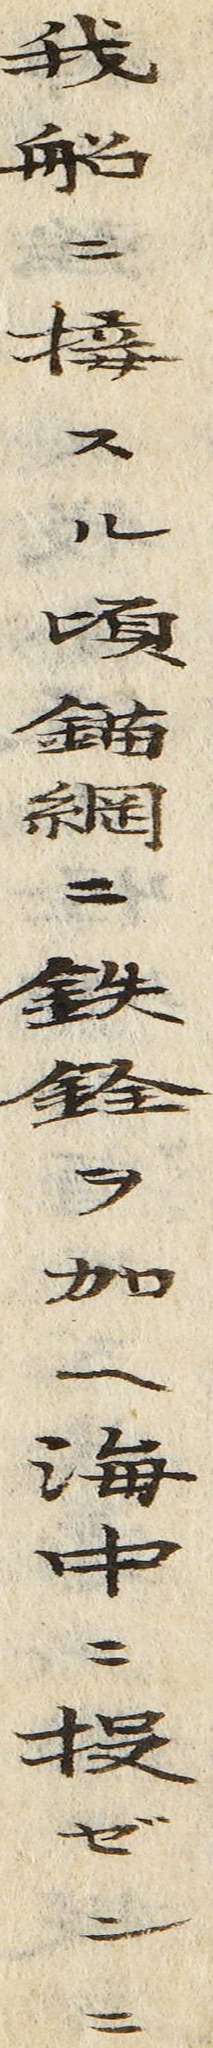我船ニ接スル頃錨綱ニ鉄銓ヲ加ヘ海中ニ投ゼンニ
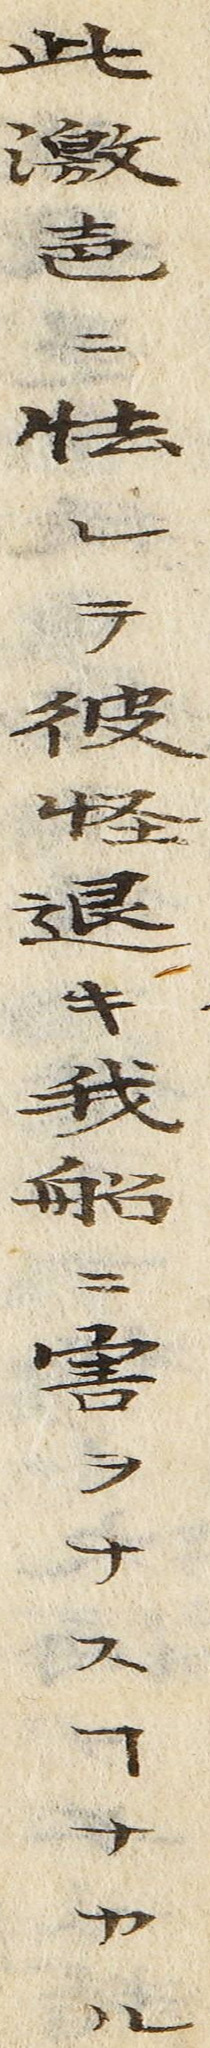此激声ニ怯レテ彼怪退キ我船ニ害をナスコトナカル
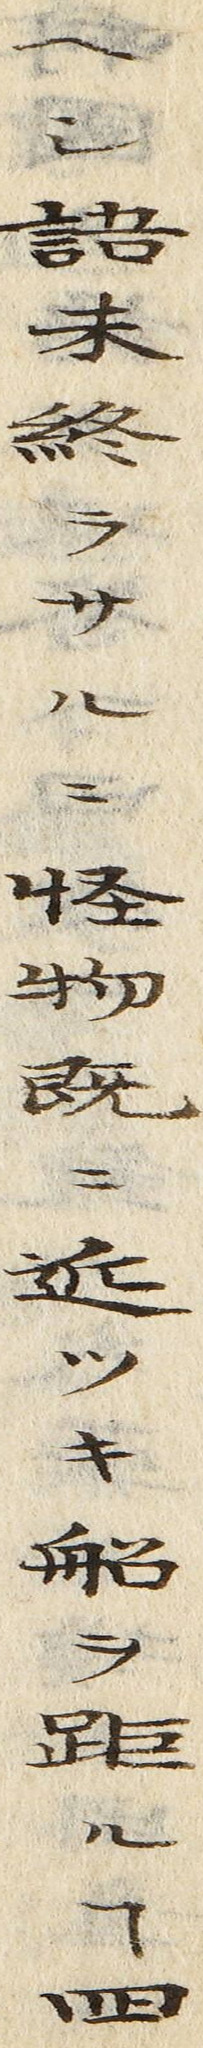ヘシ語未終ラサルニ怪物既ニ近ツキ船を距ルコト四
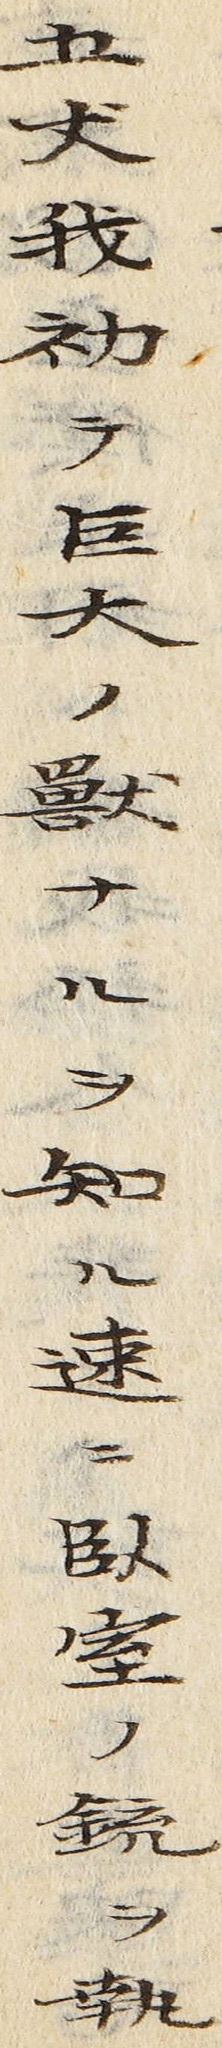五丈我初テ巨大ノ獣ナルヲ知ル速ニ臥室ノ銃ヲ執
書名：漂流紀事
